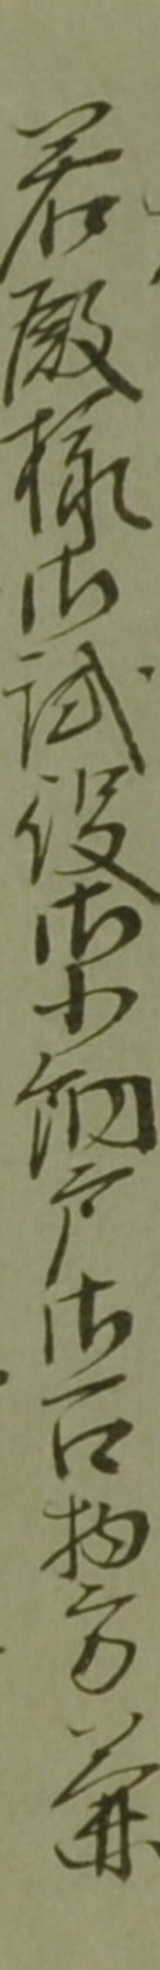若殿様御試役御小納戸御召物方兼
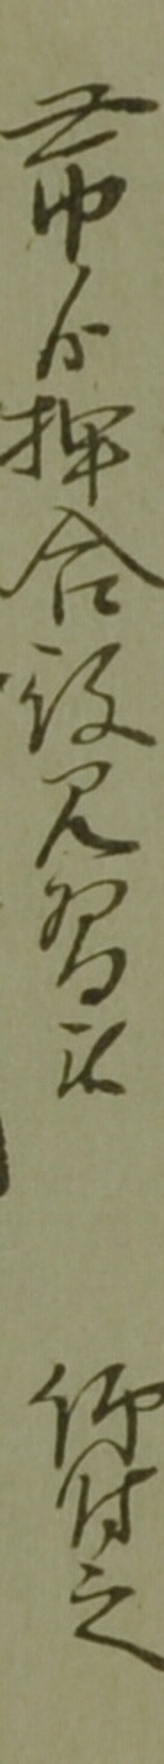帯ゟ押合役見習被仰付之
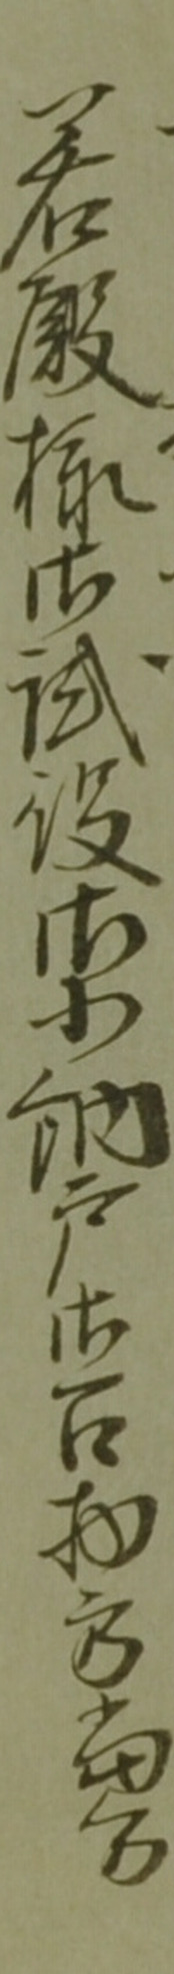若殿様御試役御小納戸御召物方兼
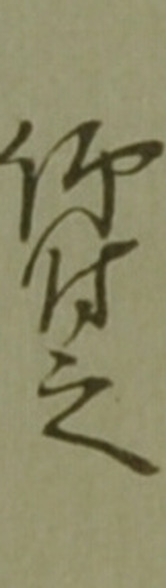仰付之
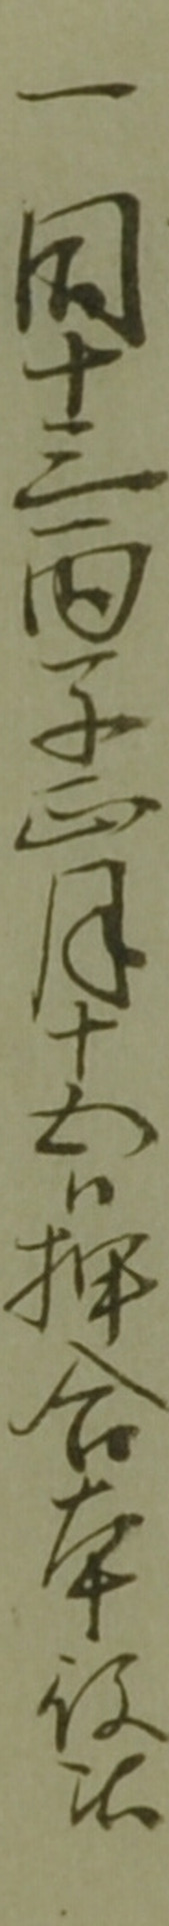一同十三丙子正月十五日押合本役被
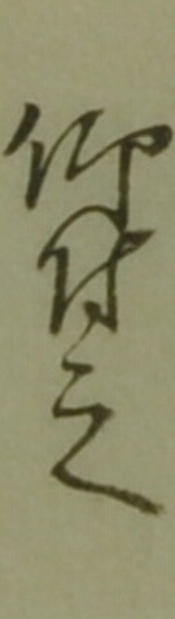仰付之

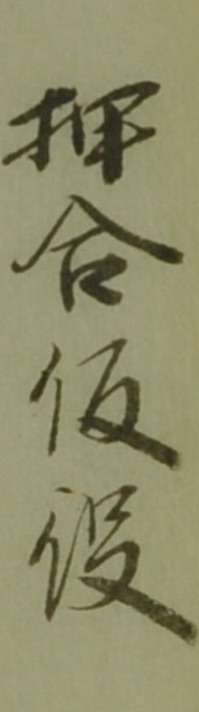押合仮役
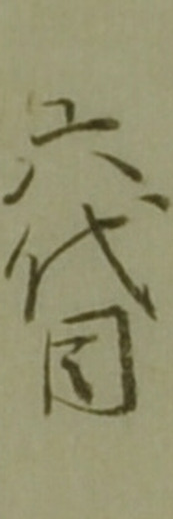六代目
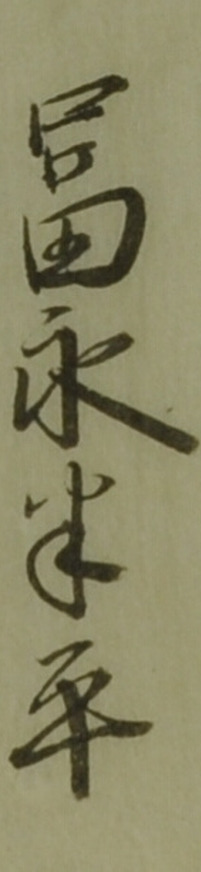冨永半平
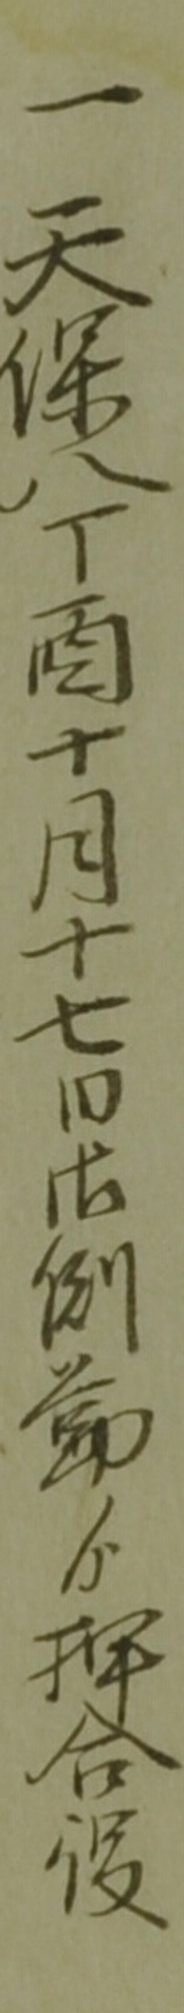一天保八丁酉十月十七日御側勤ゟ押合役
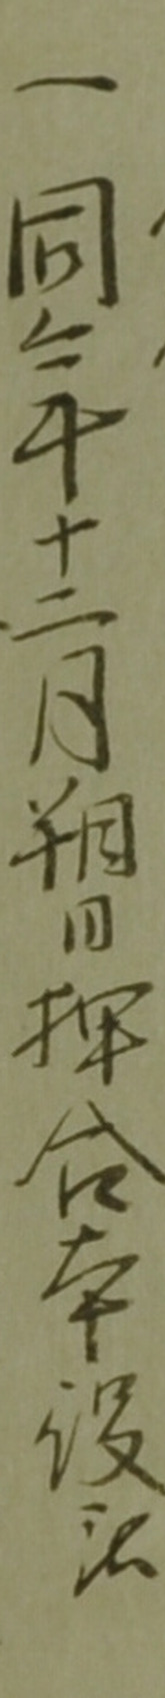一同年十二月朔日押合本役被
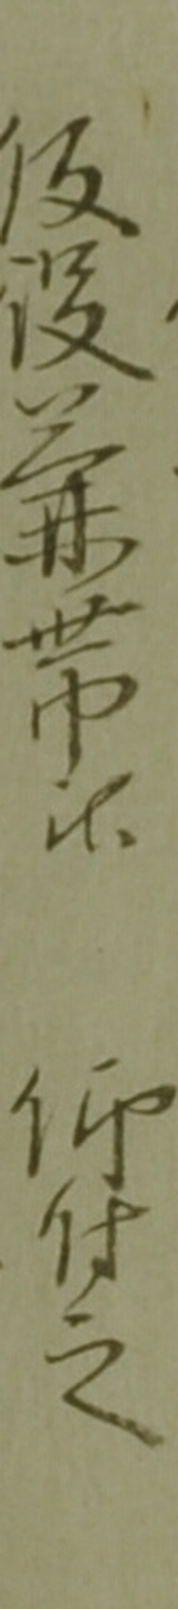仮役兼帯被仰付之
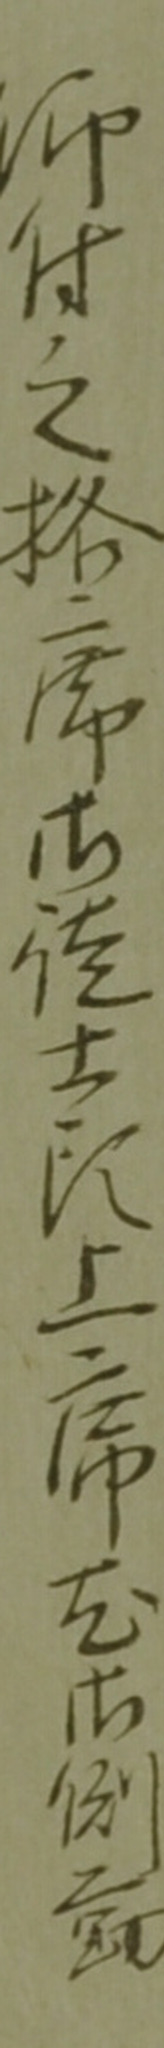仰付之格席御徒士頭上席尤御側勤

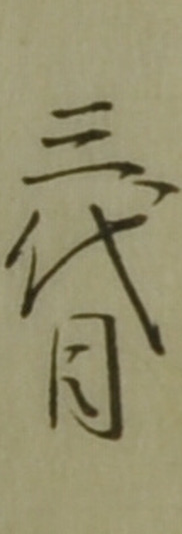三代目
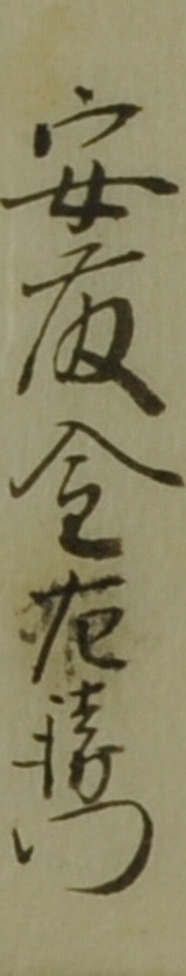安藤金左衛門
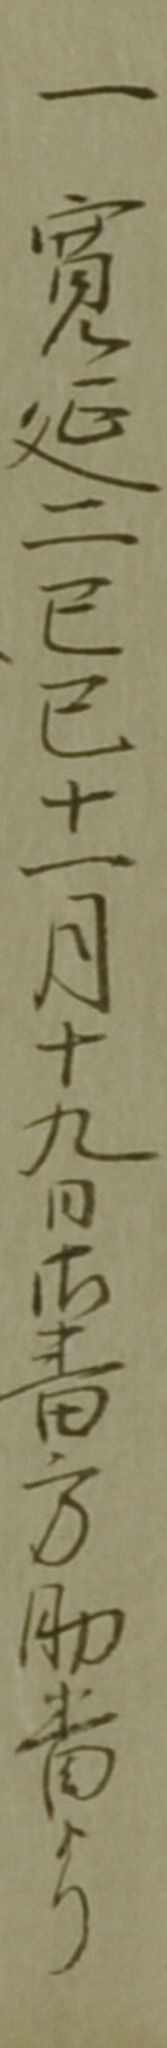一寛延二己巳十一月十九日御番方助番より
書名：諸御役代々録（七）
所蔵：伊那市立高遠町図書館・合同会社AMANE
